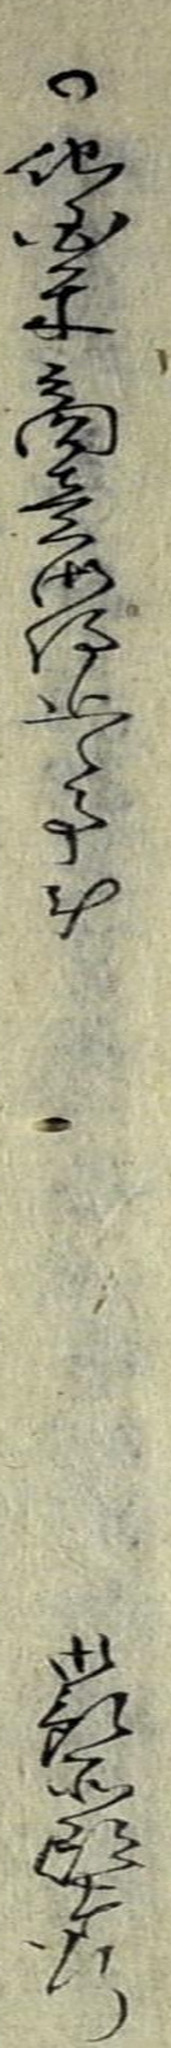〇他国米商売御停止之事斗御預所郡奉行
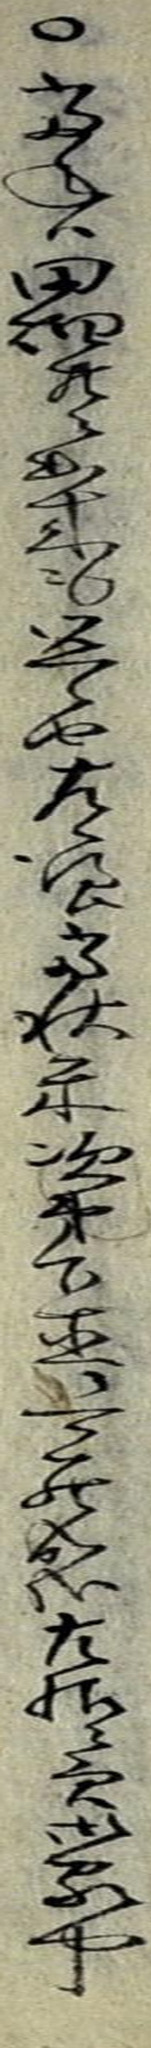〇当年ハ田畑共ニ出来も宜候由左候得ハ当秋米次第下直ニ可罷成哉左様ニ而ハ御家中
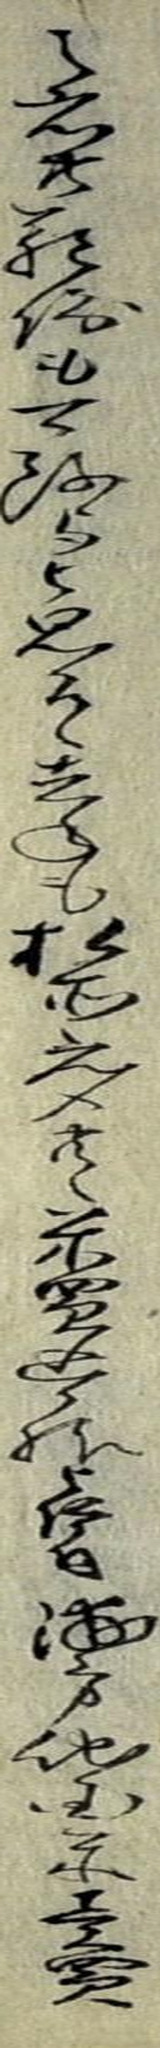之者共難儀も可致与被思召候去年も札所元〆共へ米買込候様被仰付浦方他国米売買
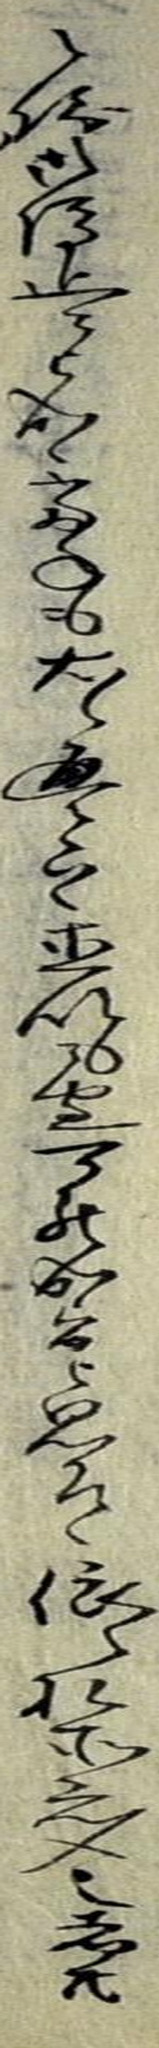之儀御停止ニ被成候当年も右之通ニ候ハヽ直段も宜可罷成候旨被思召候依之札所元〆之者共
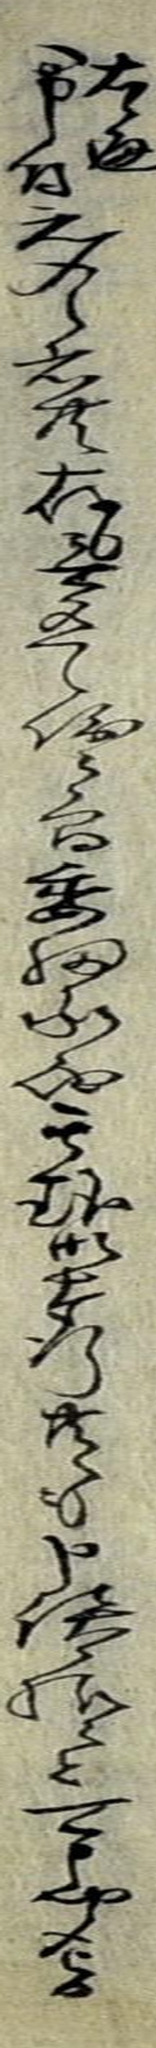へ右之通申付元〆之者共存も可有之儀ニ候間委細承届其趣御奉行共へも申談候様ニと可申聞旨
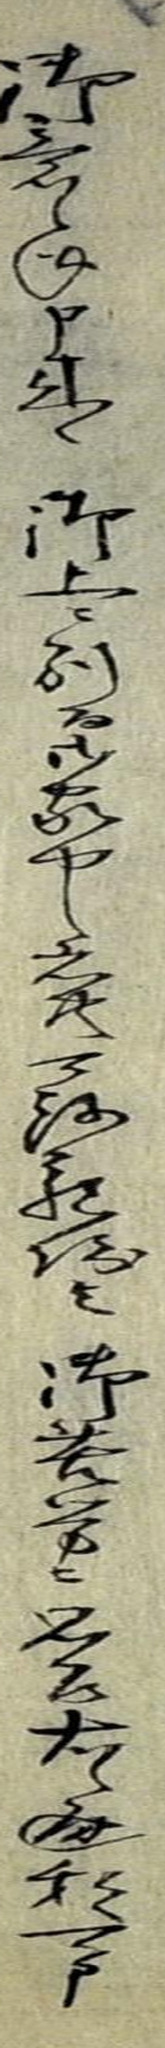御意之趣申来候御上ニ別而御家中之者共可致難儀与御苦労被思召右之通私へ可申
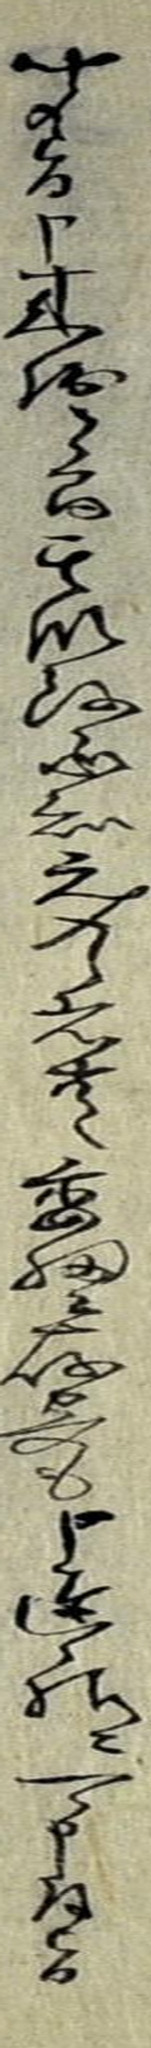聞旨申来儀ニ候間其段致承知元〆之者共へ委細ニ存寄も申達候様ニ可申付旨
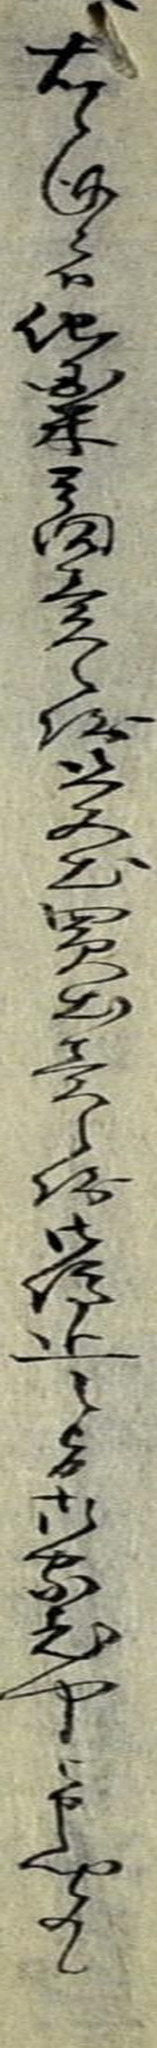一右之趣ニ付他国米商売之儀且又出買出売之儀御停止之旨御家老中被申聞候
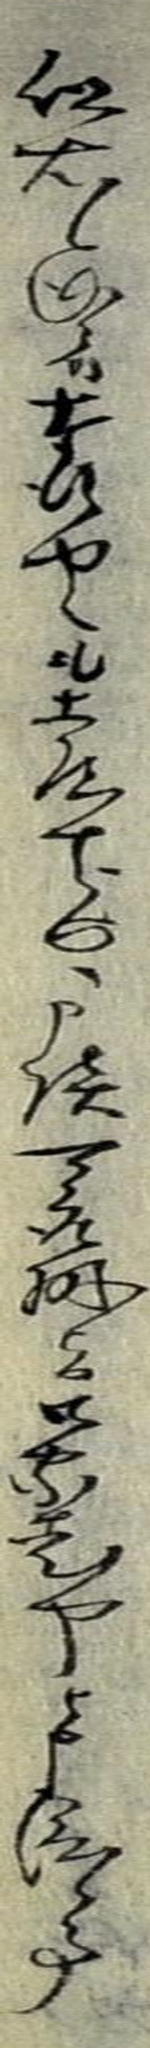但右之趣ニ付奉行中へも土屋十郎右衛門へ申談可取扱旨御家老中被申渡候事
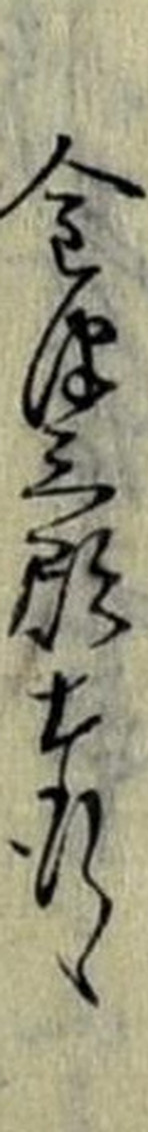金津三郡奉行へ
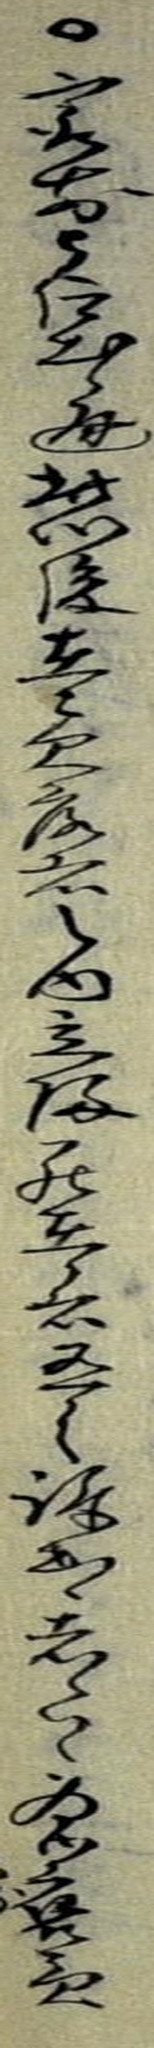〇最前被仰出候通此以後在々欠落者之内立帰罷在候者有之訴出候者候ハヽ為御褒美
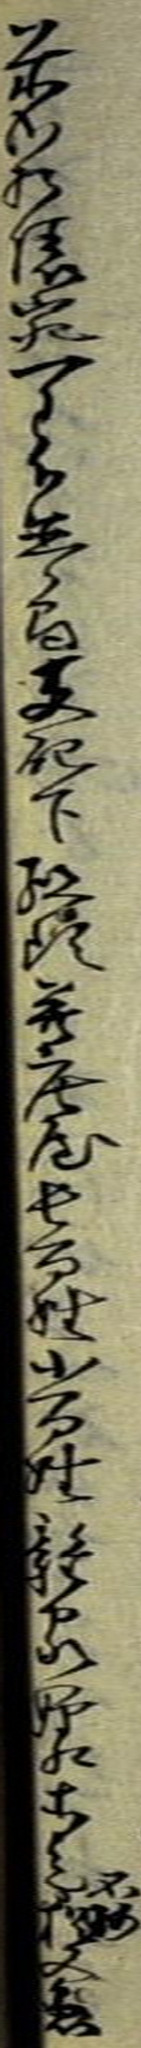米弐拾俵宛可被下置候間支配下組頭并庄屋長百姓小百姓雑家等迄不残猶又急
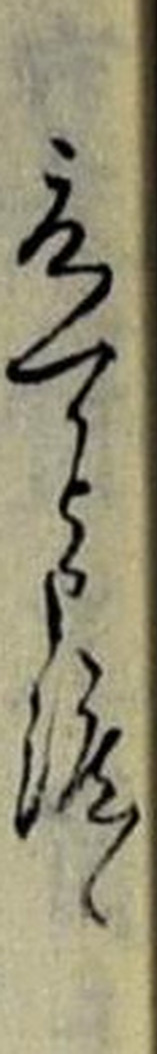度可被申渡候
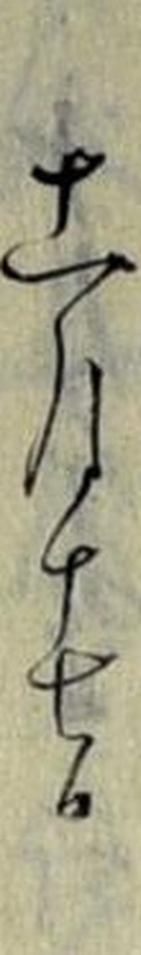十一月十七日
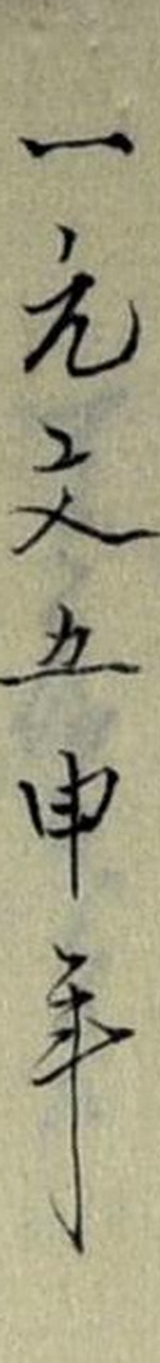一元文五申年
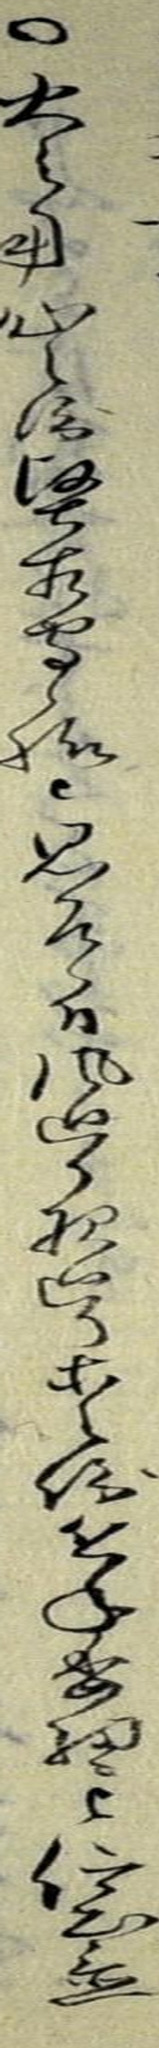〇火之用心之儀堅相守候様被思召候付風廻り夜廻り等之儀近年委細ニ被仰出置
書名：命令之部 一
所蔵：福井県文書館 Fukui Prefectural Archives
